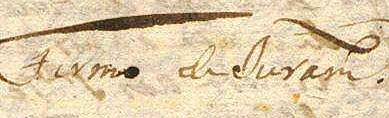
Termo de Iuram.to
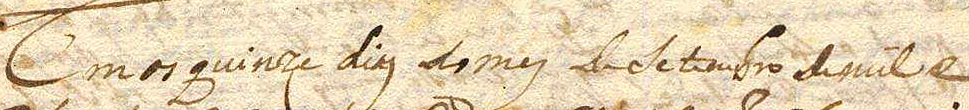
Em os quinze dias do mes de Setembro de mil e
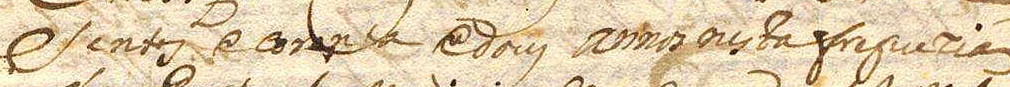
Sentos e corenta e dous annos nesta freguezia
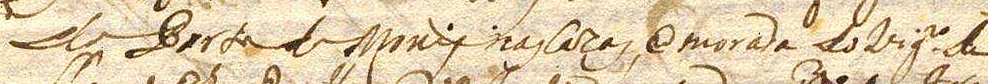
do Porto de Monis nas Cazas, e morada do Vig.ro de
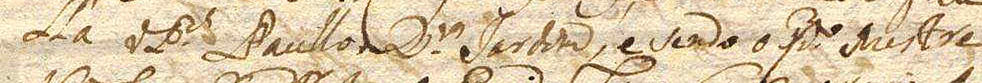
lla o P.e Paullo V.ra Iardim, e sendo o R.do Mestre
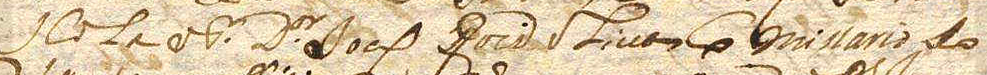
sCola o s.r Do.r Ioaꝭ Rois̄ oLiua Comissario do
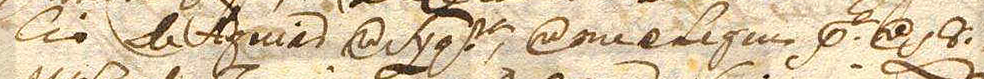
Cio de Aguiar e Syq.ra, e me eLegeu p.a escri
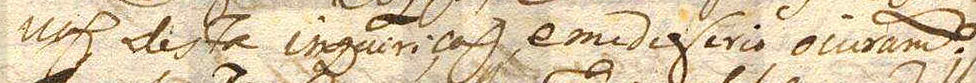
uaõ desta inquiriçaꝭ, e me deferio o iuram.to
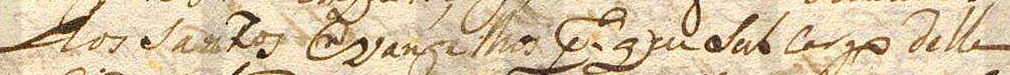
Aos santos Evangelhos p.a que sub cargo delle
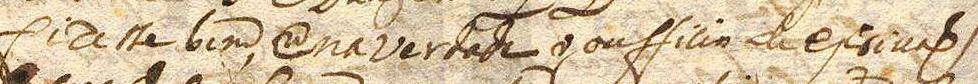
fizesse bem, e na verdade o oufficio de esciuaõ
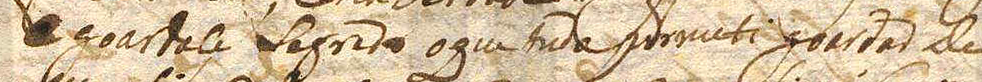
e goardace segredo o que tuda pormeti goardar de
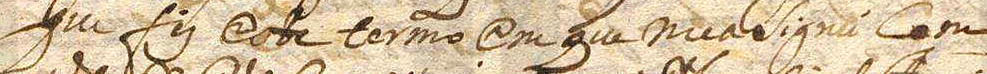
que fis este termo em que me asignei Com
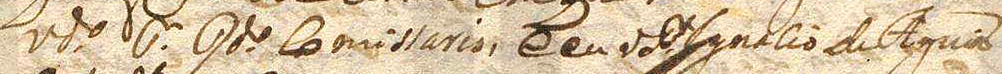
o d.o s.r Rd.o Comissario, e eu o P.e Ignacio de Aguiar
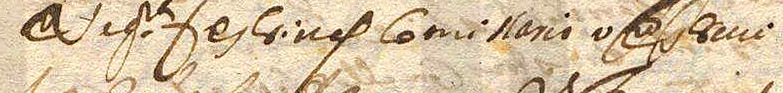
e seq.ra esCriuaꝭ Comissario o esreui
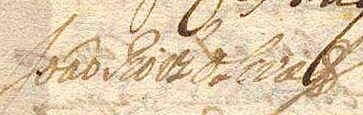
Joaõ Roiz̄ OLiva
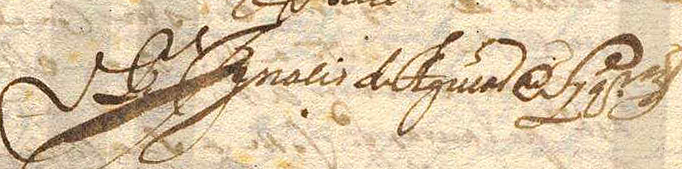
O P.e Jgnacio de Aguiar e Syq.ra
